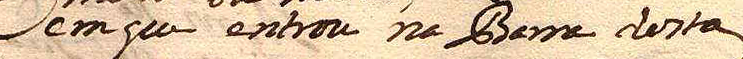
em que entrou na Barra desta
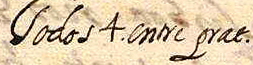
Todos 4 entre prat.
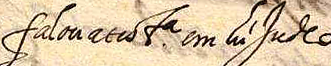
falou a testa. em hū Judeo
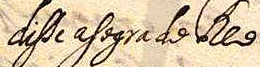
disse a sogra do Reo
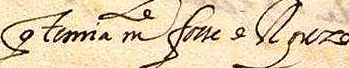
q̄ temia mto fosse o R prezo
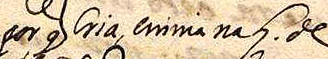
porq̄ Cria, e uiuia na L. de
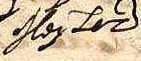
MoyZez
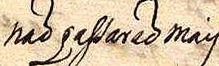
naõ passaraõ mais.
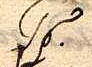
Tp.o
